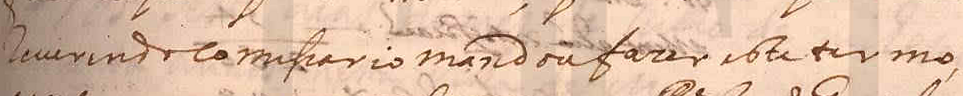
Reuerendo comissario mandou fazer este termo,
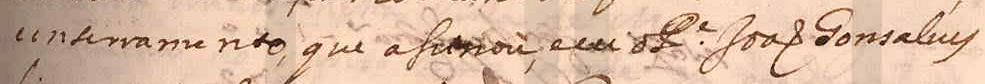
e enserramento, que assinou, e eu o P.e Joaõ Gonsalues
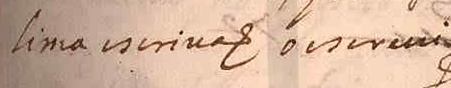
lima escriuaõ o escreui
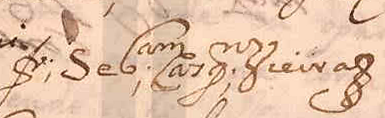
fr. Seb;am Casq.ro Vieira
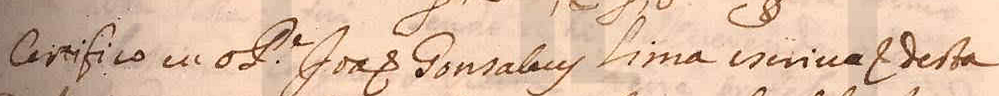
Certifico eu o P.e Joaõ Gonsalues Lima escriuaõ desta
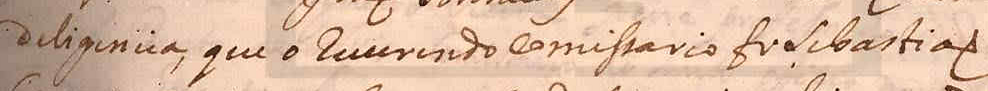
deligencia, que o Reuerendo Comissario fr Sebastiaõ
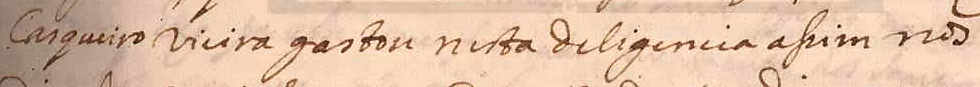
Casqueiro vieira gastou nesta deligencia assim nos
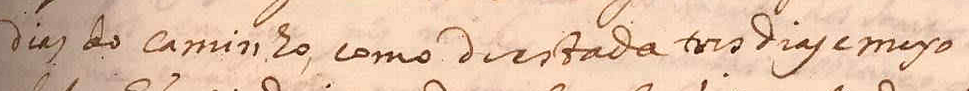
dias do caminho, como de estada tres dias e meyo
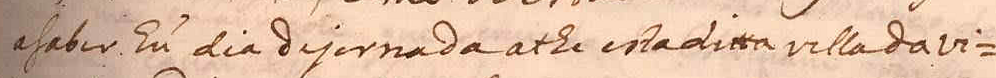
a saber hū dia de jornada athe esta ditta villa da vi
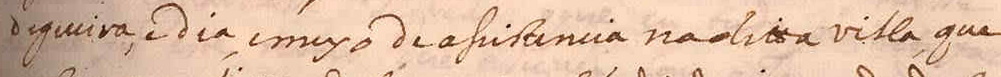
digueira, e dia, e meyo de assistencia na ditta villa, que
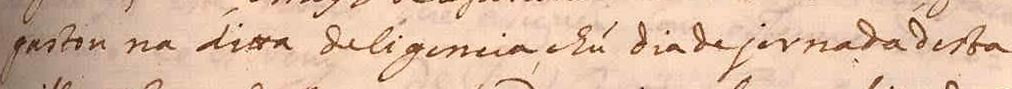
gastou na ditta deligencia, e hū dia de jornada desta
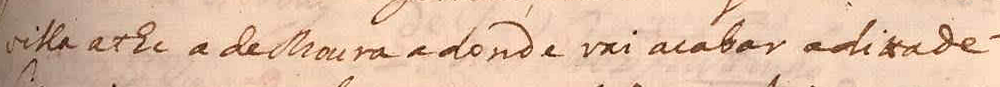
villa athe a de Moura adonde vai acabar a ditta de
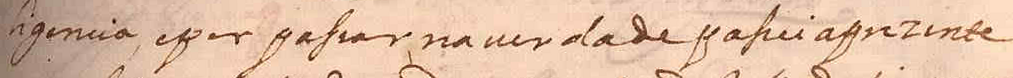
ligencia, e por passar na uerdade passei a prezente
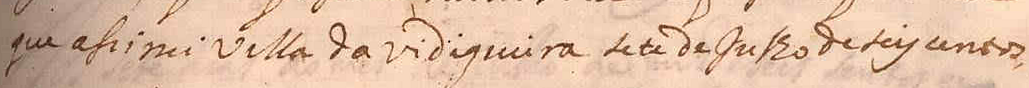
que assinei villa da vidigueira sete de Julho de seiscentos,
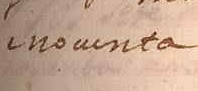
e nouenta
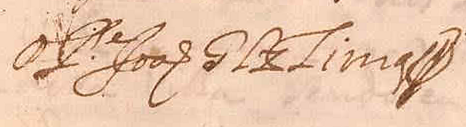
o P.e Joaõ Glz̄ Lima
